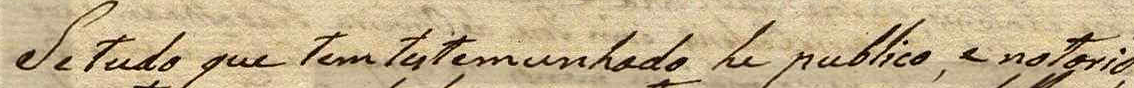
Se tudo que tem testemunhado he publico, e notorio,
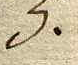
5
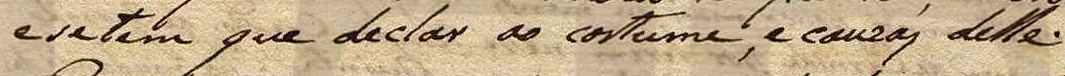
e se tem que declar ao costume, e cauzas delle.
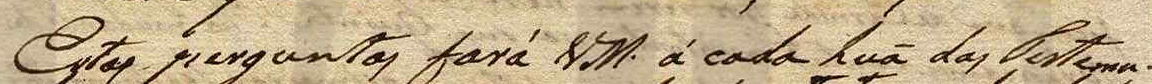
Estas perguntas fará VM. a cada huā das Testemu
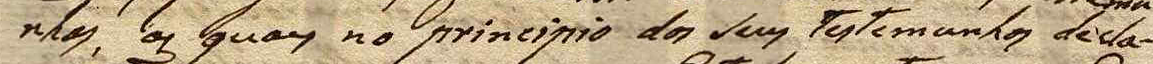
nhas, as quaes no principio dos seus testemunhos decla
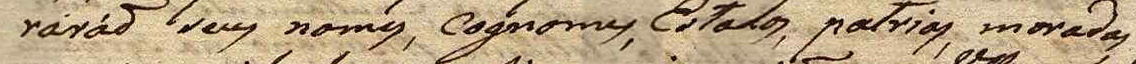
raraõ seus nomes, cognomes, Estados, patrias, moradas,
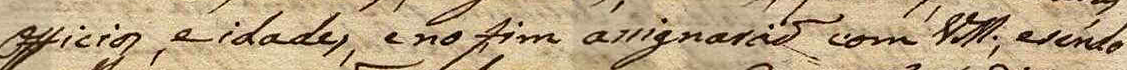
officios, e idades, e no fim assignaraõ com VM., e sendo
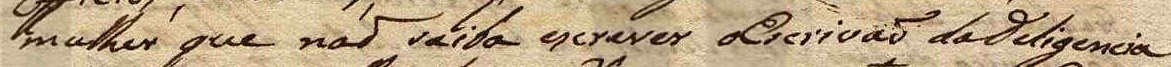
mulher que naõ saiba escrever o Escrivaõ da Deligencia
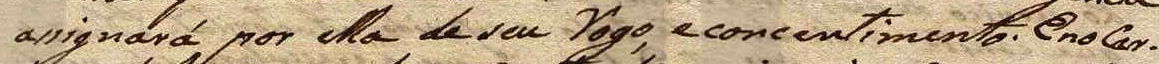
assignará por ella de seu Rogo, e concentimento. E no car
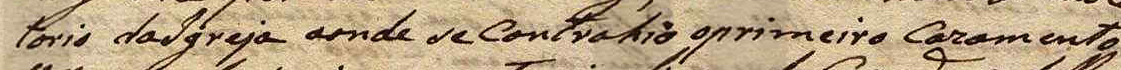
torio da Igreja aonde se contrahio o primeiro Cazamento
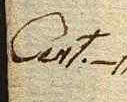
Cert.
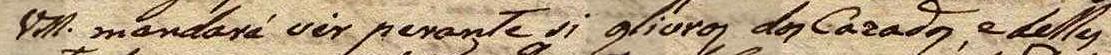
VM. mandará vir perante si os livros dos Cazados, e delles
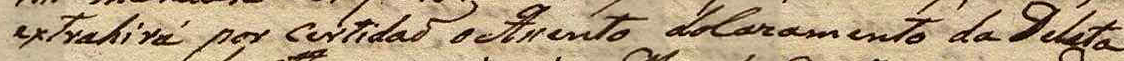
extrahirá por certidaõ o Assento do Cazamento da Delata
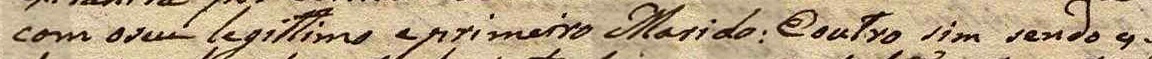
com o seu legittimo e primeiro Marido: E outrosim sendo es
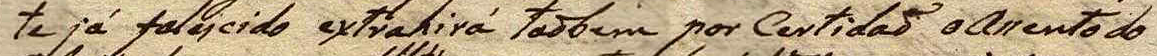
te já falescido extrahirá taõbem por certidaõ o assento do
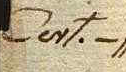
Cert.
